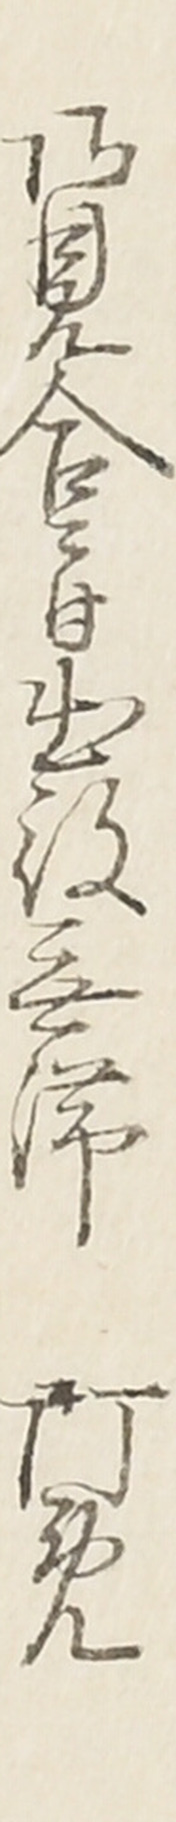御見合ニ付出役無滞御免
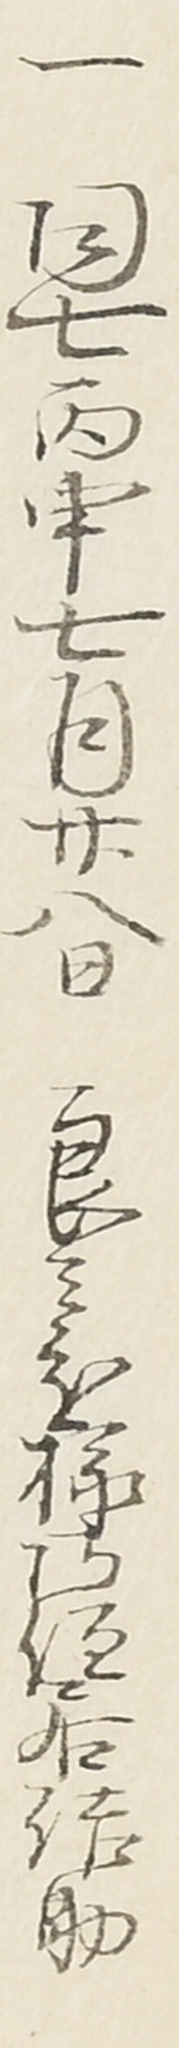一同七丙申七月廿八日良之進様御住居詰助
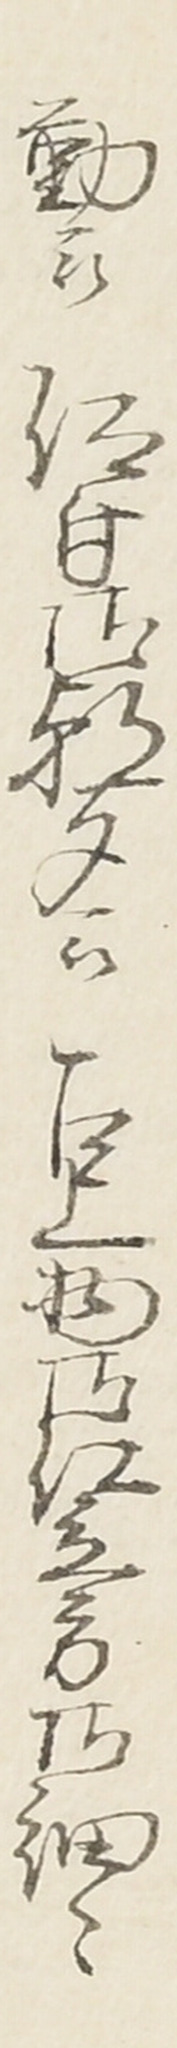勤被仰付御朝夕被召上物御仕立方御細々
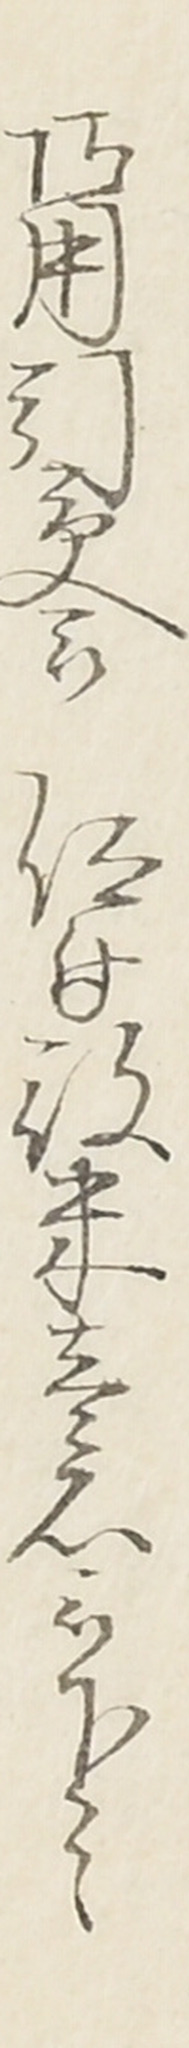御用引受被仰付役米壱石被下之
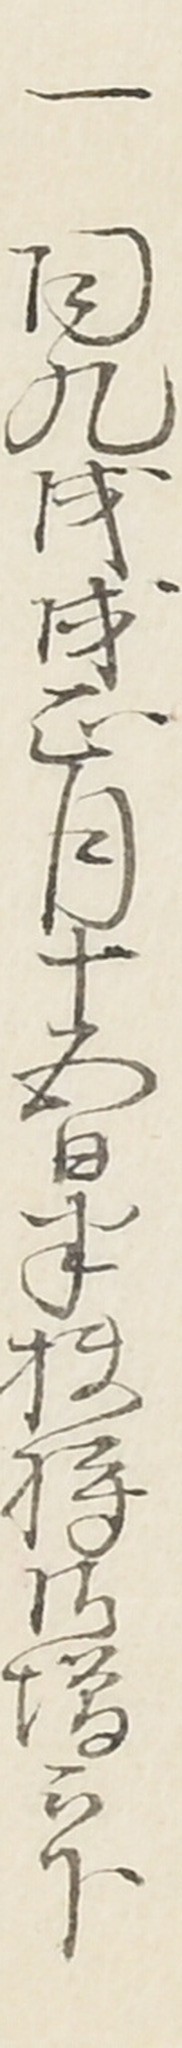一同九戊戌正月十五日半扶持御加増被下
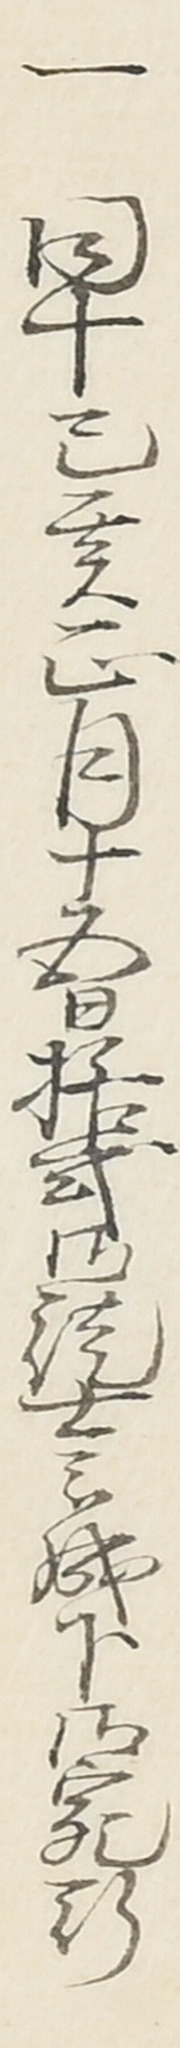一同十己亥正月十五日格式御徒士被成下御宛行
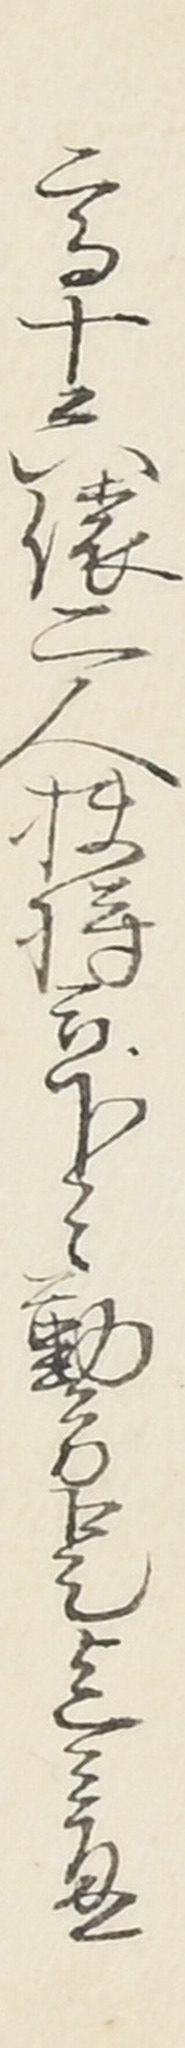高十六俵二人扶持被下之勤方是迄之通
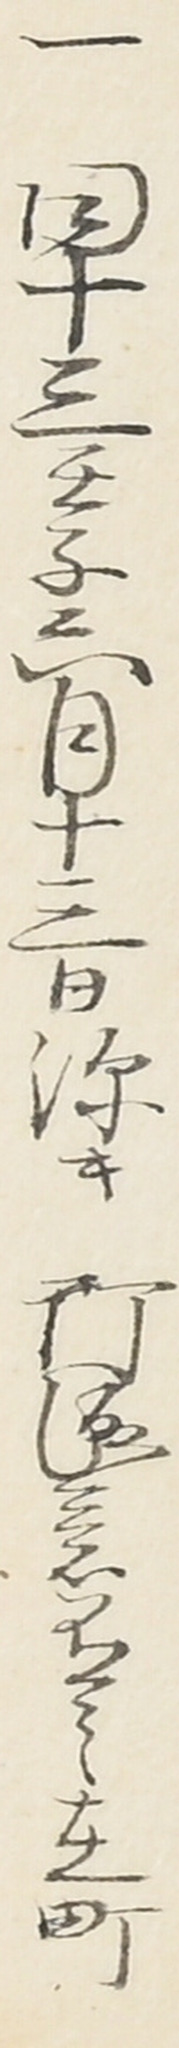一同十三壬子六月十三日深キ御趣意有之在町

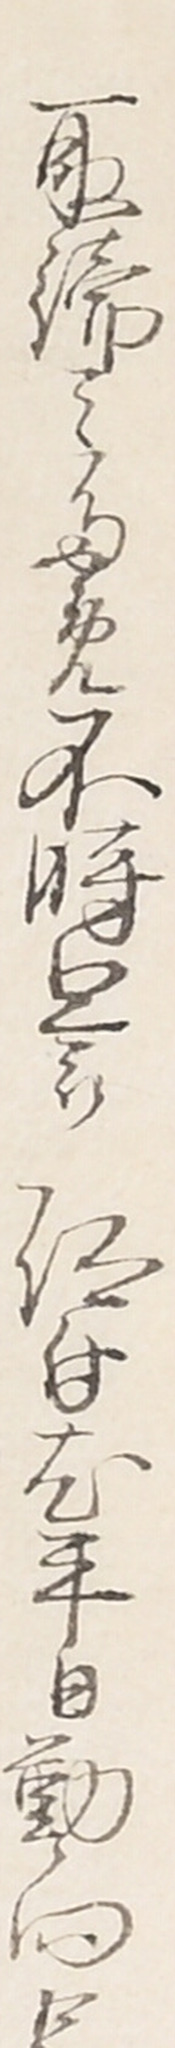取締之ため不時廻被仰付尤平日勤向是
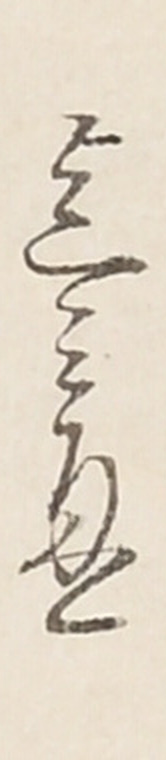迄之通
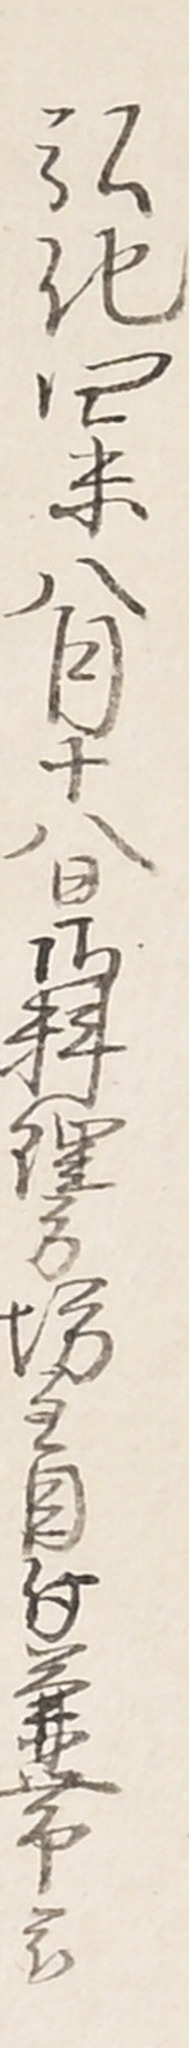一弘化四未八月十八日御料理方坊主目付兼帯被
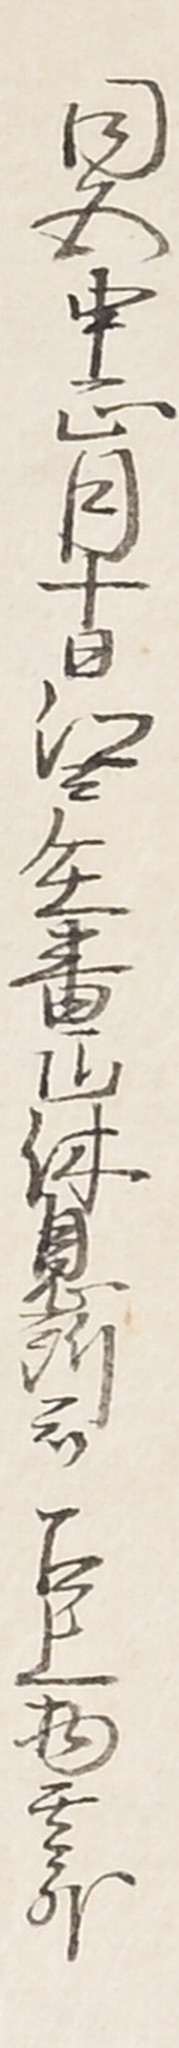一同五申正月十日江戸在番御休息所被召上物其外
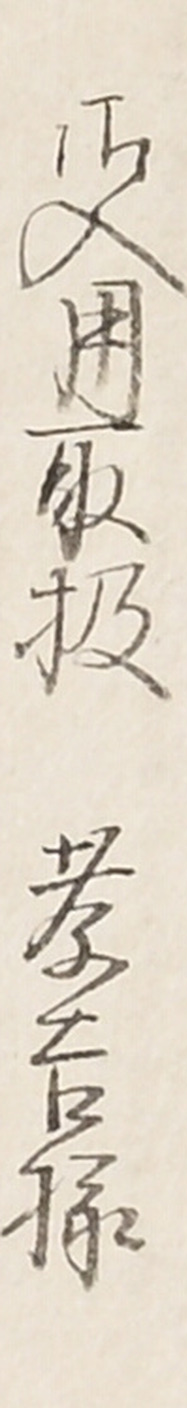御入用取扱孝吉様
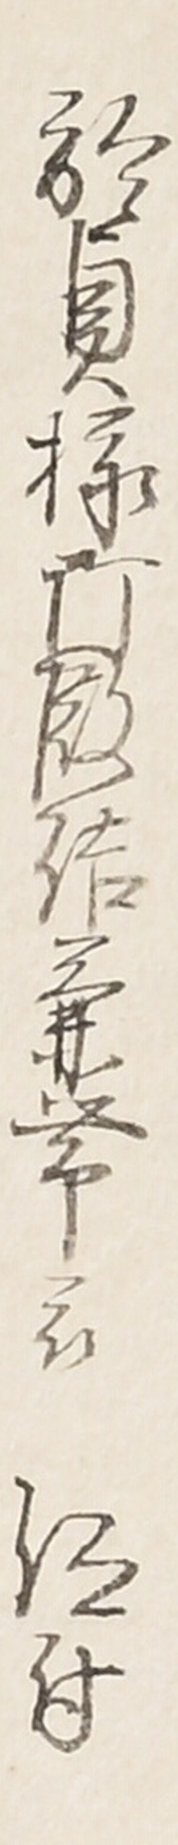於貞様御殿詰兼帯被仰付

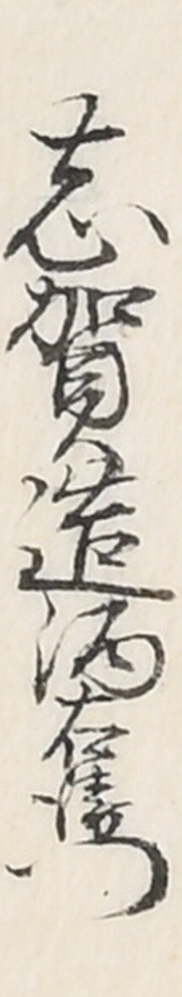志賀造酒右衛門
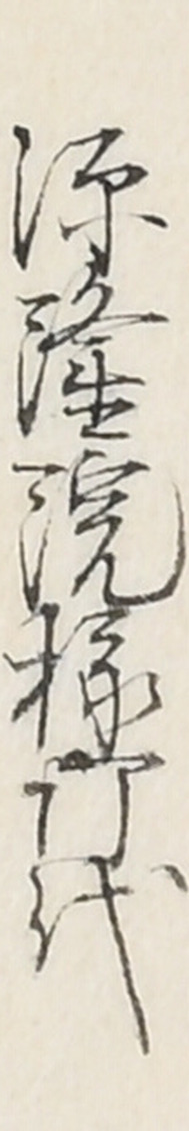源隆院様御代
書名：無足諸士勤仕録（四）
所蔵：伊那市立高遠町図書館・合同会社AMANE
